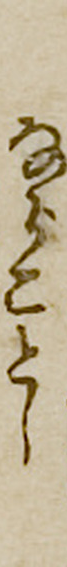ならことし
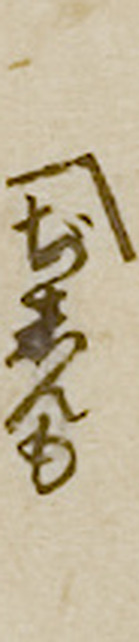乁ぢしんも
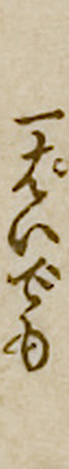一ぱいでも
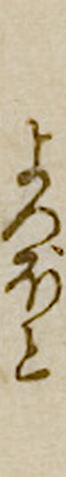よつほと
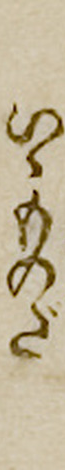いいものだ
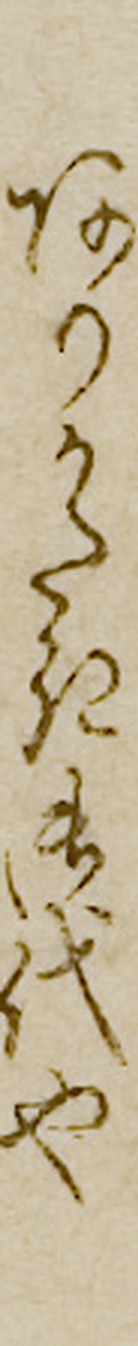ありかたき御代や
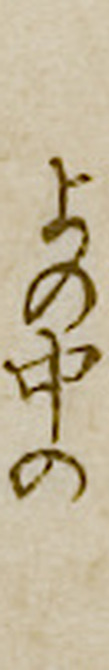よの中の
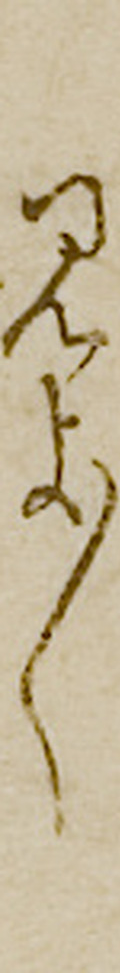見よ〳〵
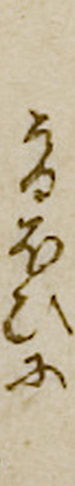うるほひに
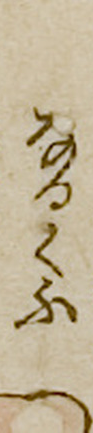なるくふ
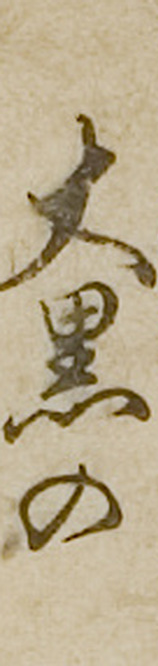大黒の
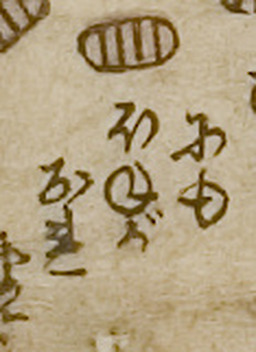ほねが
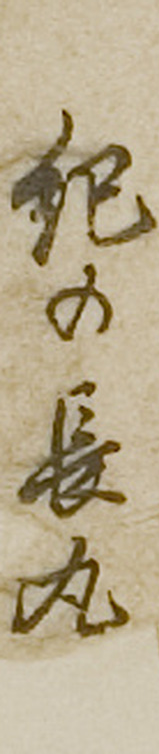紀の長丸
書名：[大黒のつち]
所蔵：東京大学総合図書館 General Library in the University of Tokyo, JAPAN
